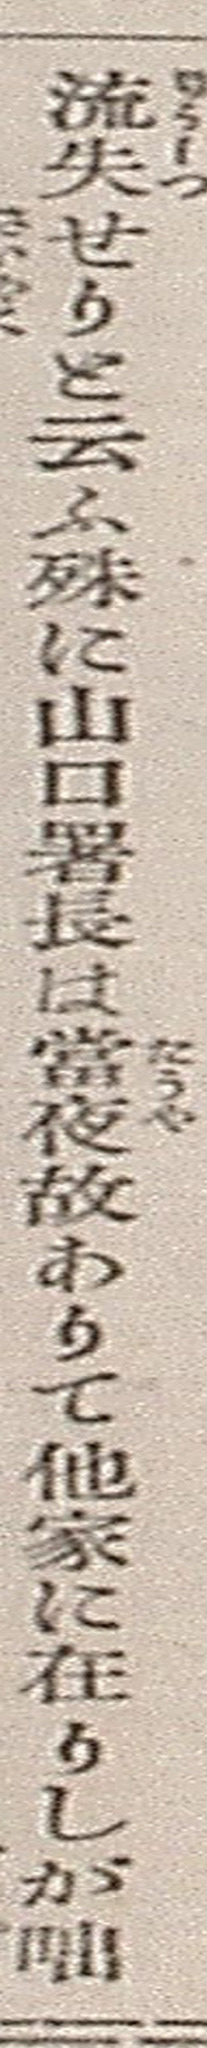流失せりと云ふ殊に山口署長は当夜故ありて他家に在りしが咄
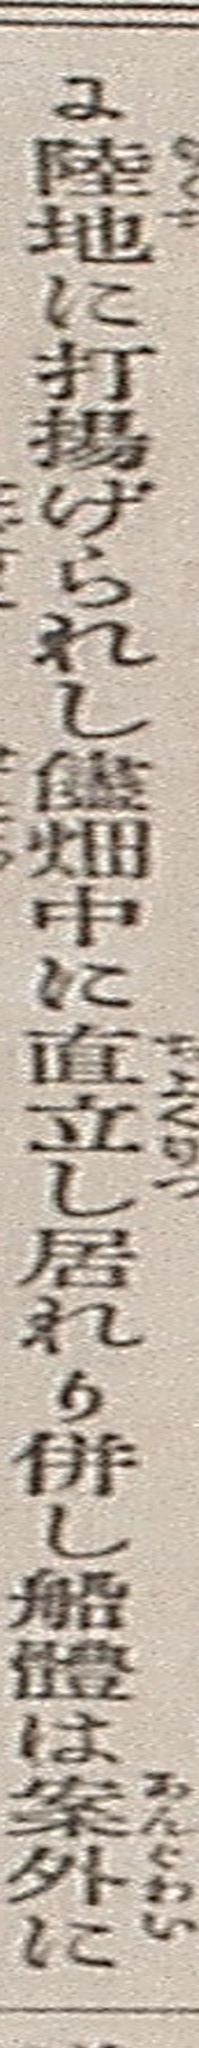に陸地に打揚げられし侭畑中に直立し居れり併し船体は案外に
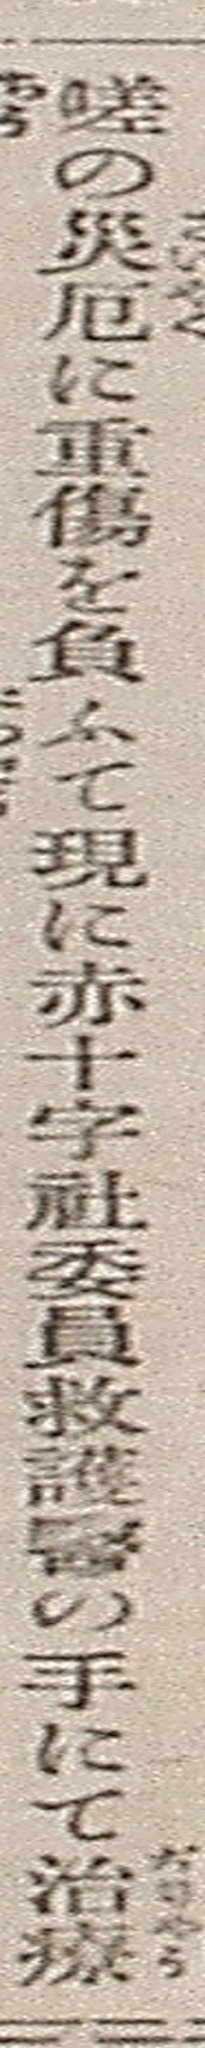嗟の災厄に重傷を負ふて現に赤十字社委員救護医の手にて治療
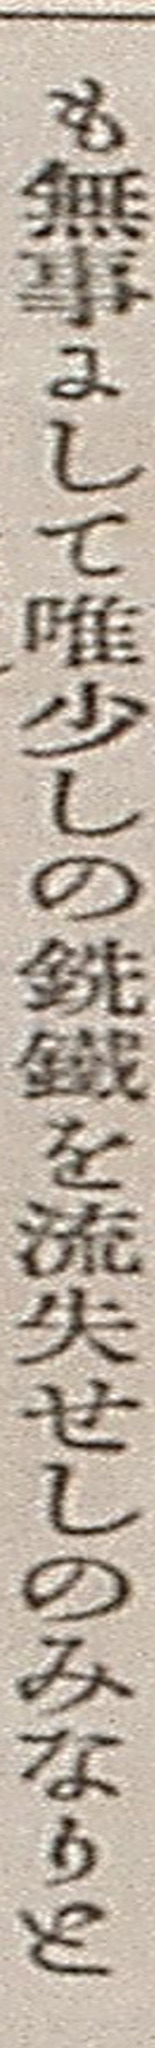も無事にして唯少しの銑鉄を流失せしのみなりと
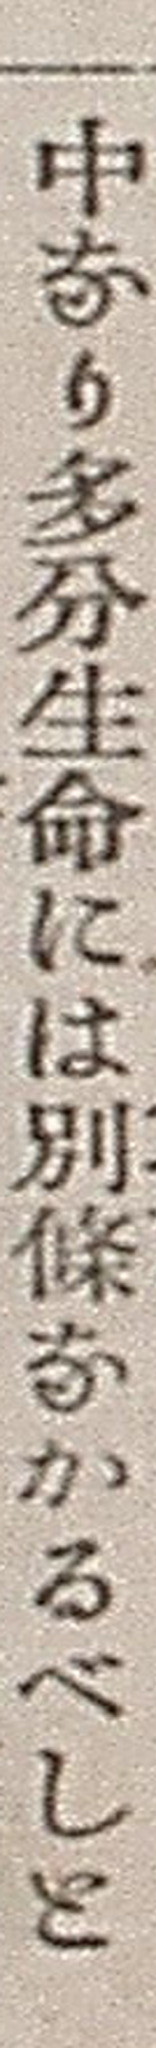中なり多分生命には別条なかるべしと
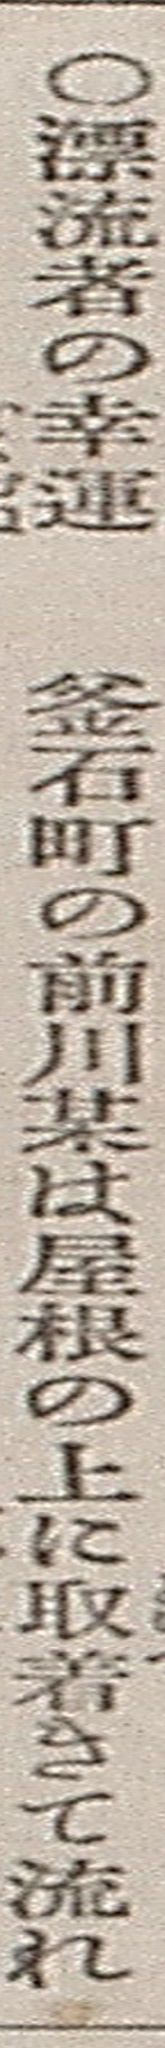○漂流者の幸運釜石町の前川某は屋根の上に取着きて流れ
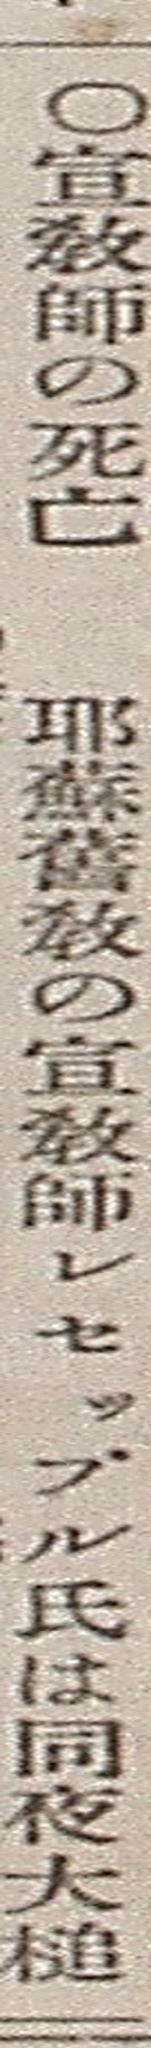○宣教師の死亡耶蘇旧教の宣教師レセップル氏は同夜大槌
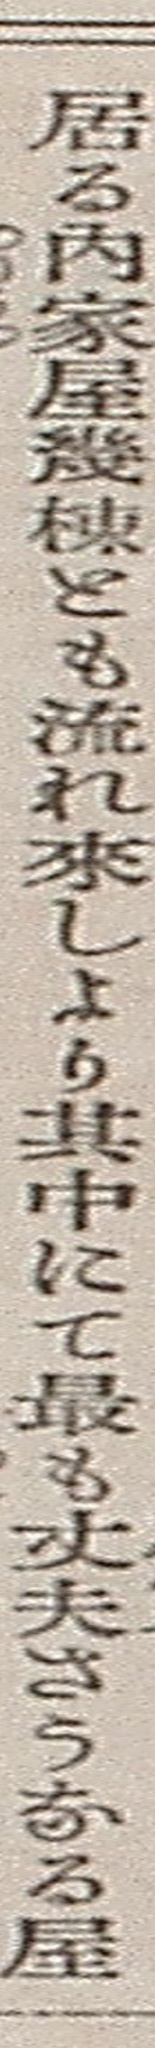居る内家屋幾棟とも流れ来しより其中にて最も丈夫さうなる屋
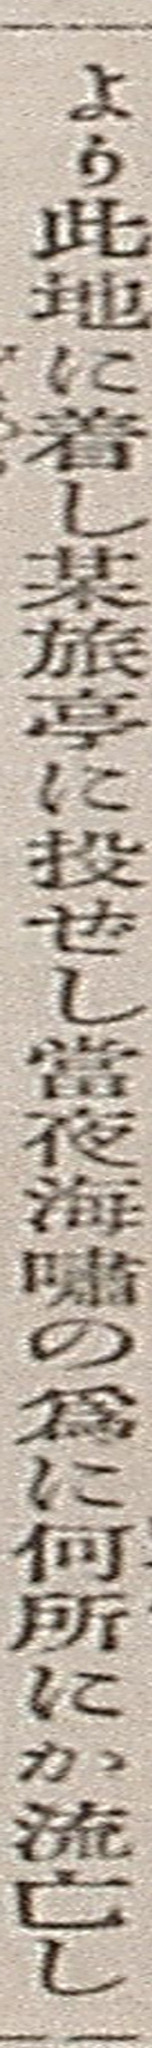より此地に着し某旅亭に投ぜし当夜海嘯の為に何所にか流亡し
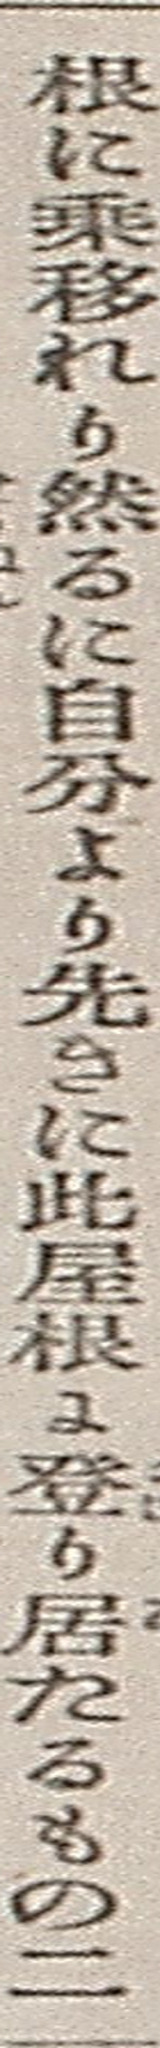根に乗移れり然るに自分より先きに此屋根に登り居たるもの二
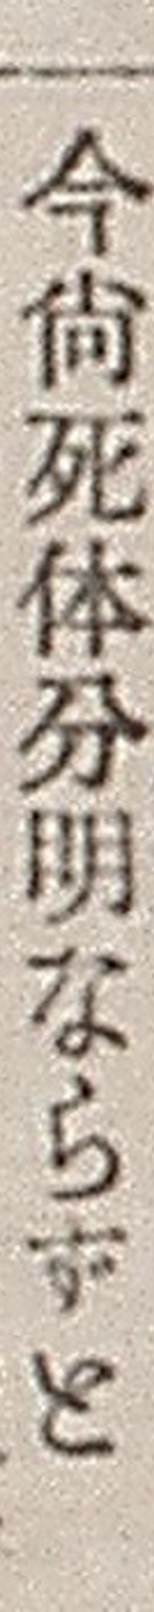今尚死体分明ならずと
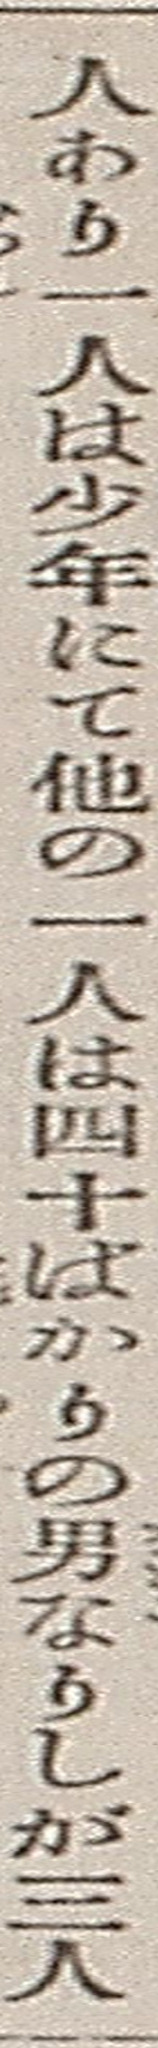人あり一人は少年にて他の一人は四十ばかりの男なりしが三人
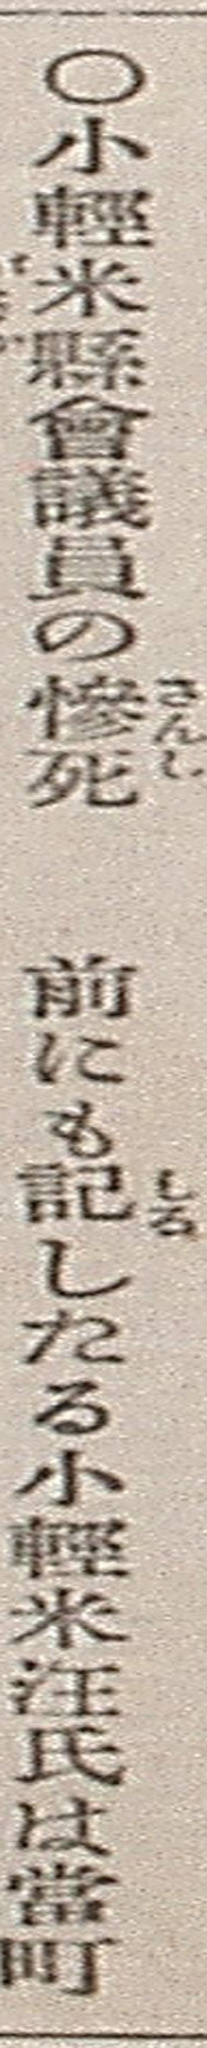○小軽米県会議員の惨死前にも記したる小軽米汪氏は当町
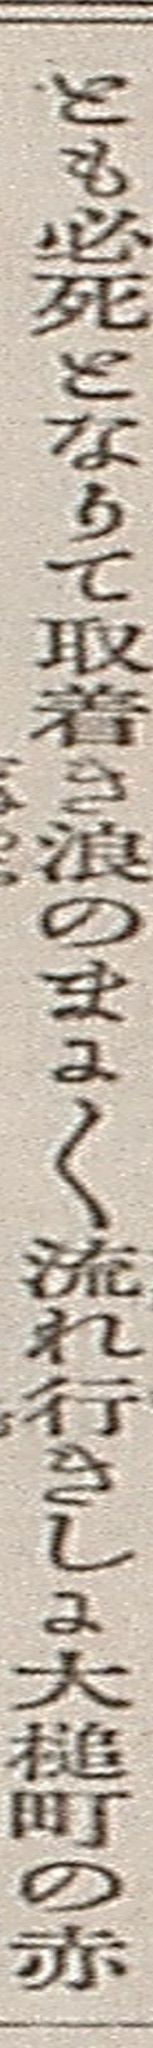とも必死となりて取着き浪のまに〳〵流れ行きしに大槌町の赤
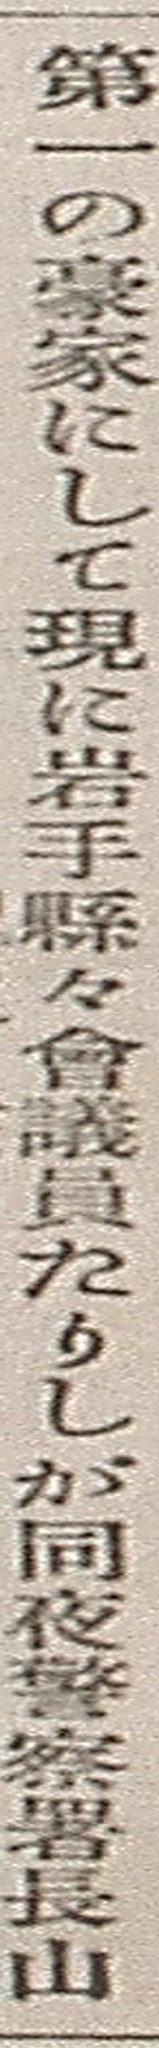第一の豪家にして現に岩手県々会議員たりしが同夜警察署長山
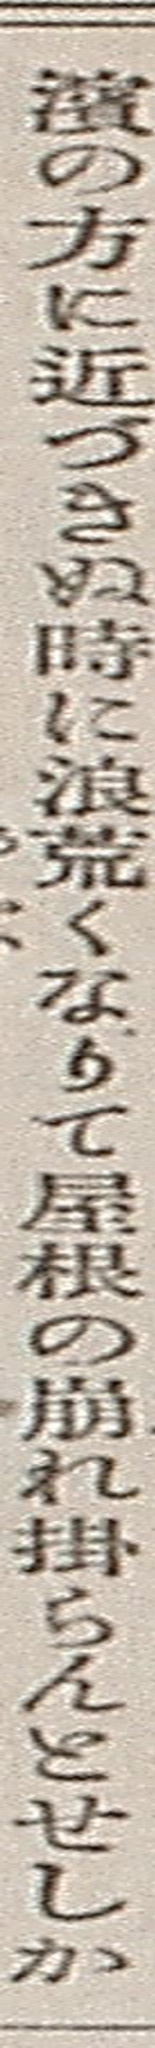浜の方に近づきぬ時に浪荒くなりて屋根の崩れ掛らんとせしか
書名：風俗畫報臨時増刊第百十九號　大海嘯被害録（中）
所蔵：東京大学地震研究所図書室 Earthquake Research Institute Library, The University of Tokyo, JAPAN
